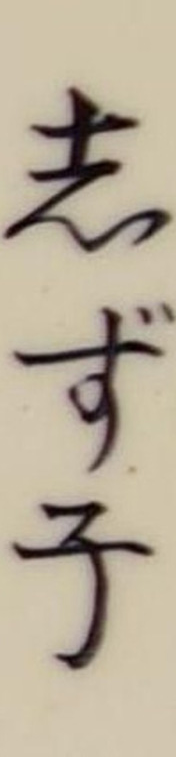しず子
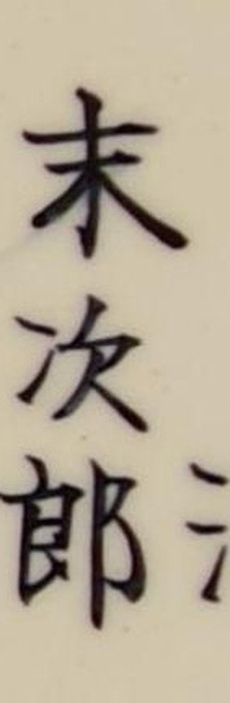末次郎
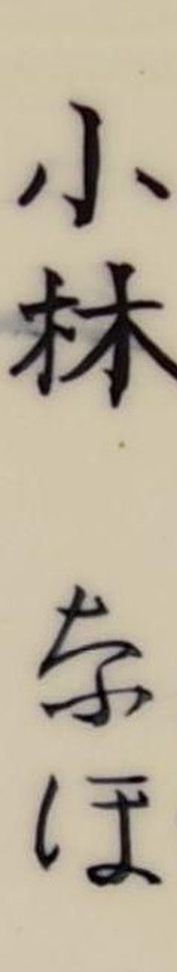小林なほ
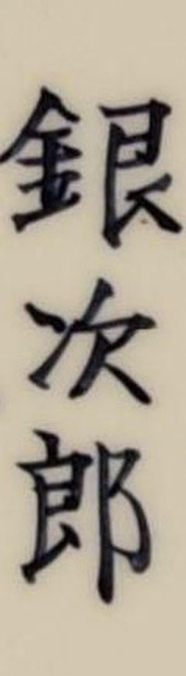銀次郎
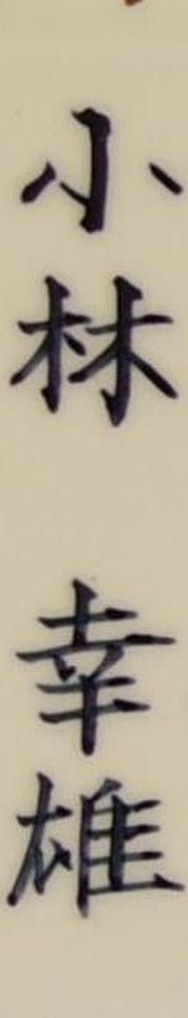小林幸雄
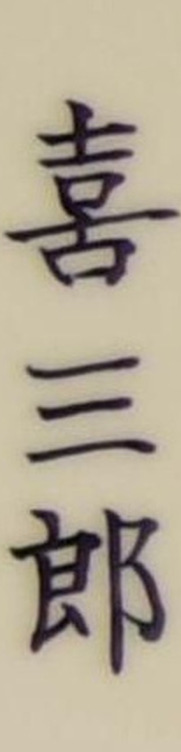喜三郎

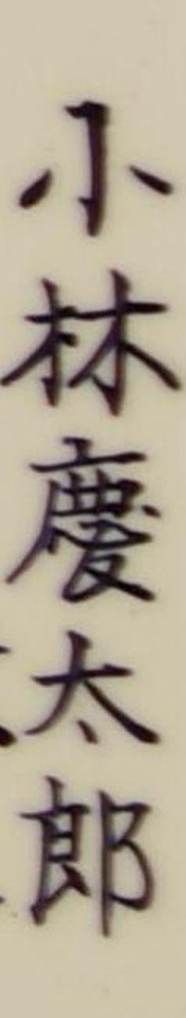小林慶太郎
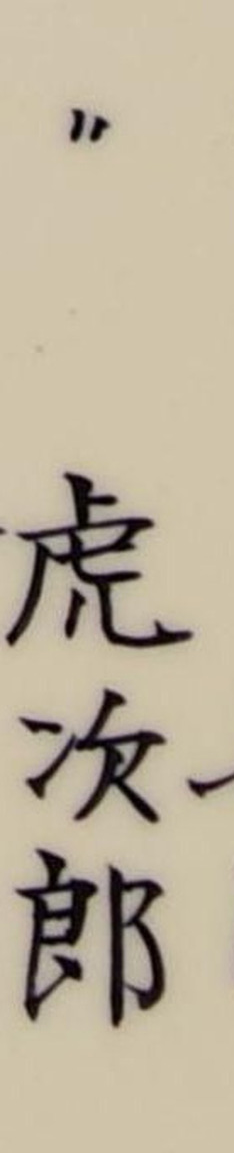虎次郎
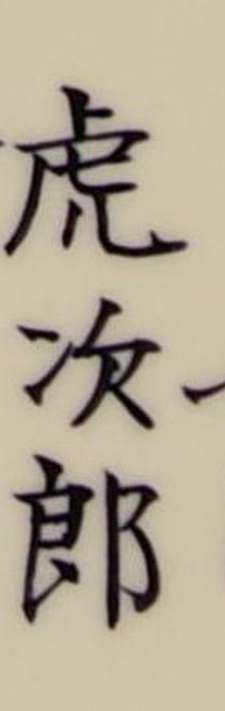虎次郎
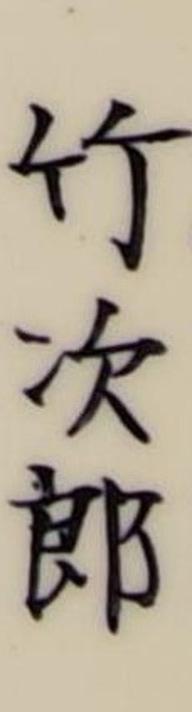竹次郎
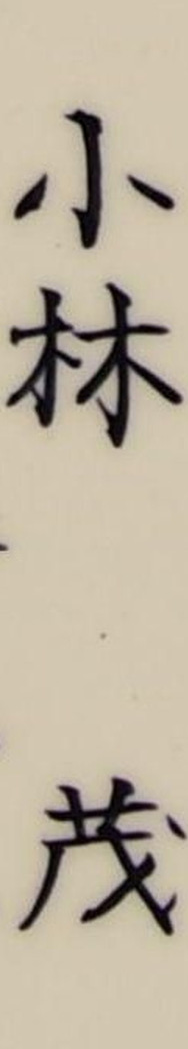小林茂
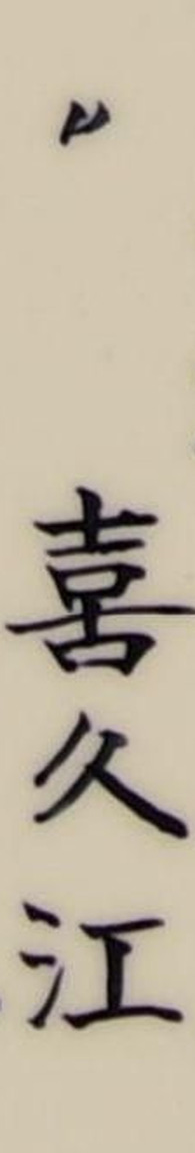喜久江
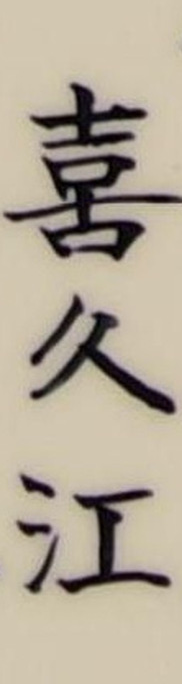喜久江
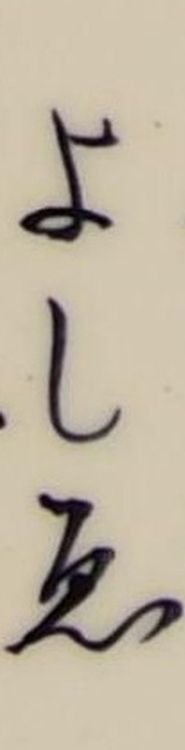よしゑ
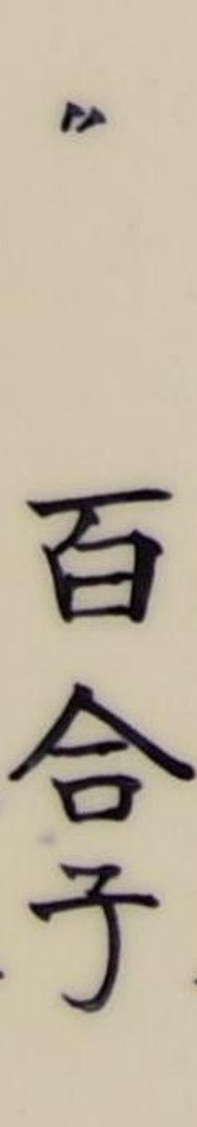百合子
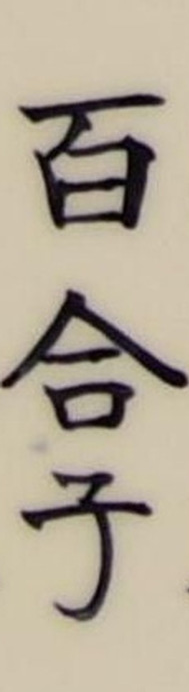百合子
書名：A~D
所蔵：koyasan kongobuji
